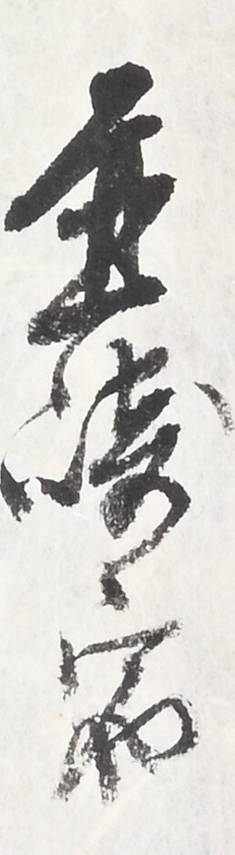並崎宿
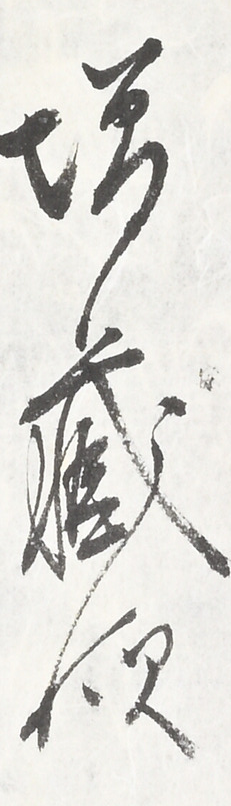増蔵様
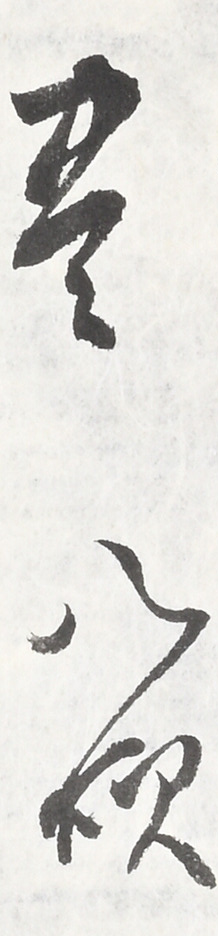豊八様
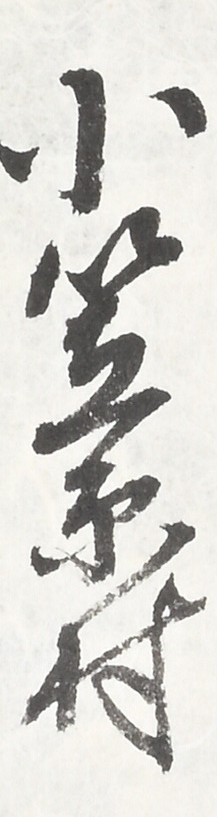小笠原村
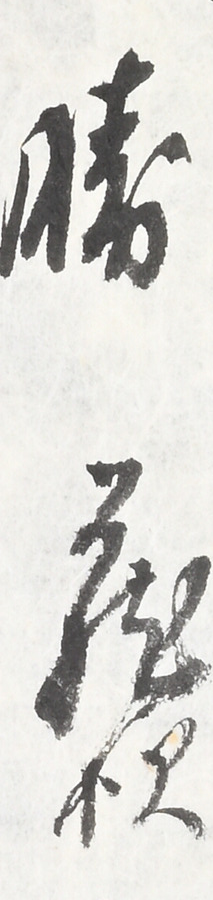勝蔵様
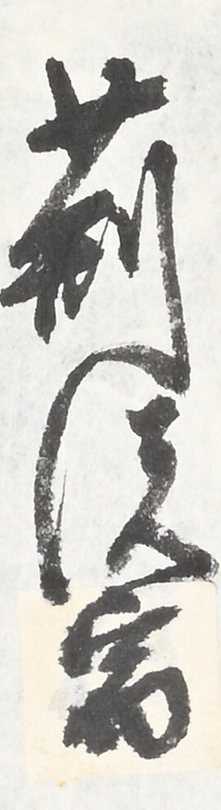荊沢宿
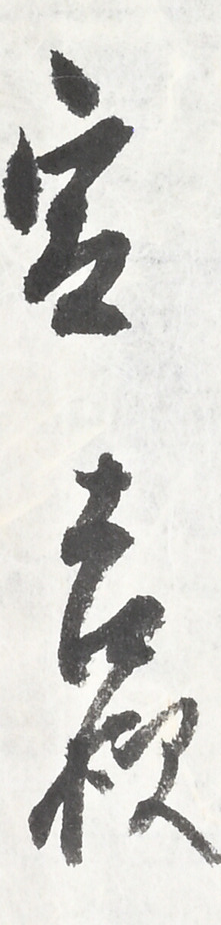定吉様
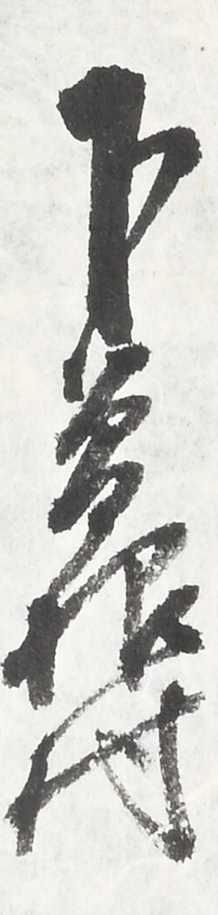下曽根村
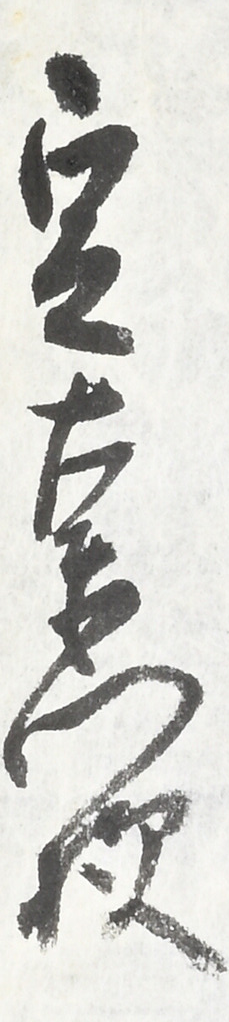定右衛門様
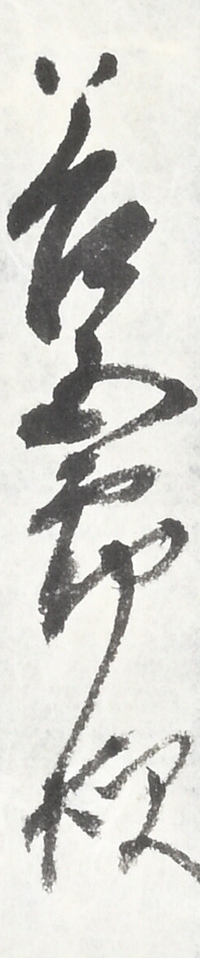善五郎様
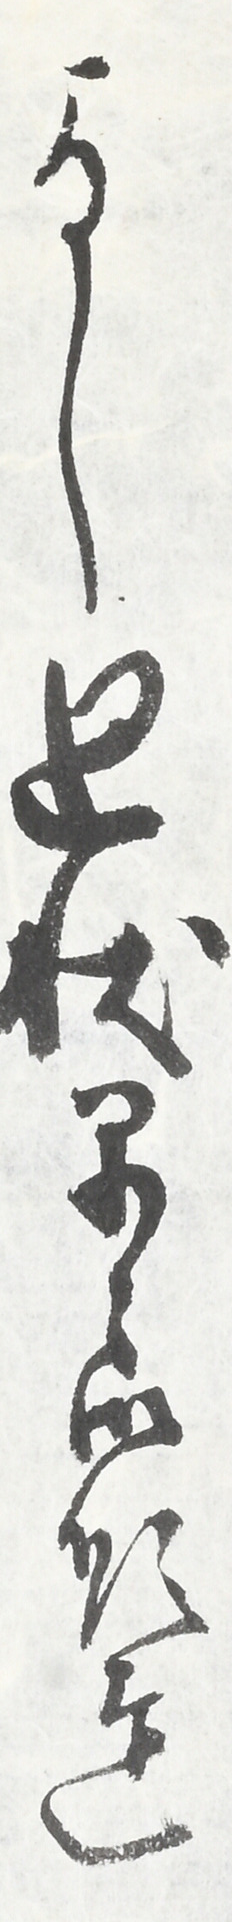尚々廻状早々御順達
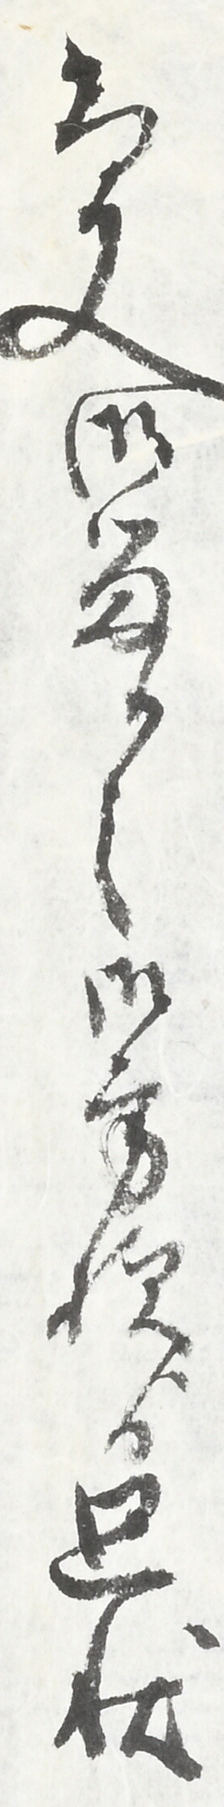尚又御留り之御方様ゟ廻状
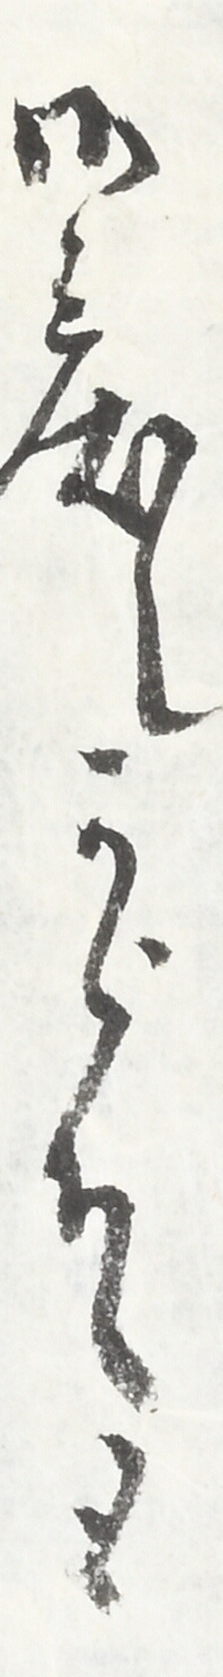御戻し可被下候以上

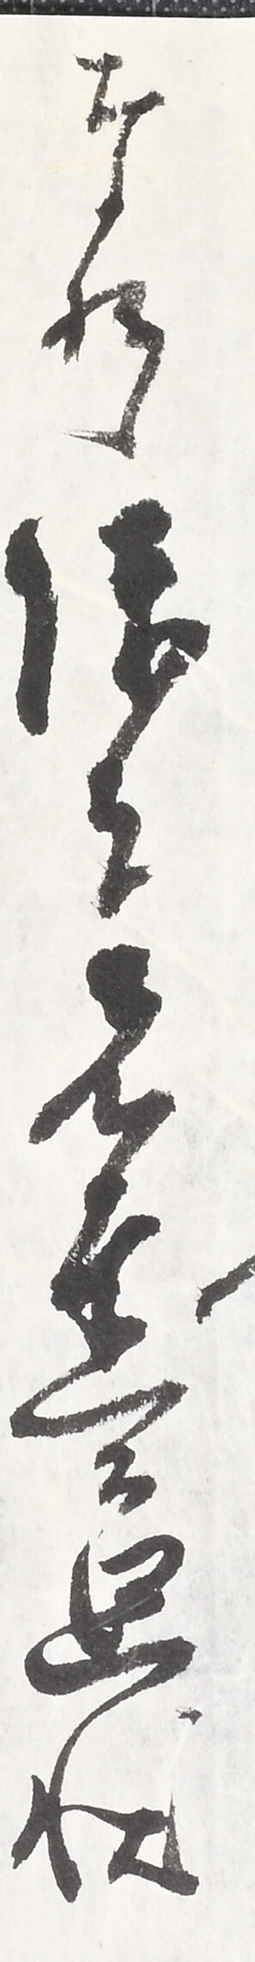奉存候陳は先達て廻状
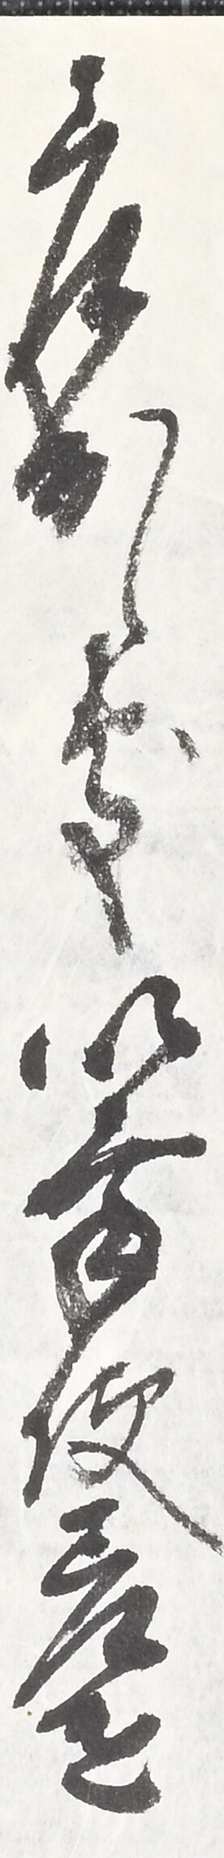差出候処以幸便差遣
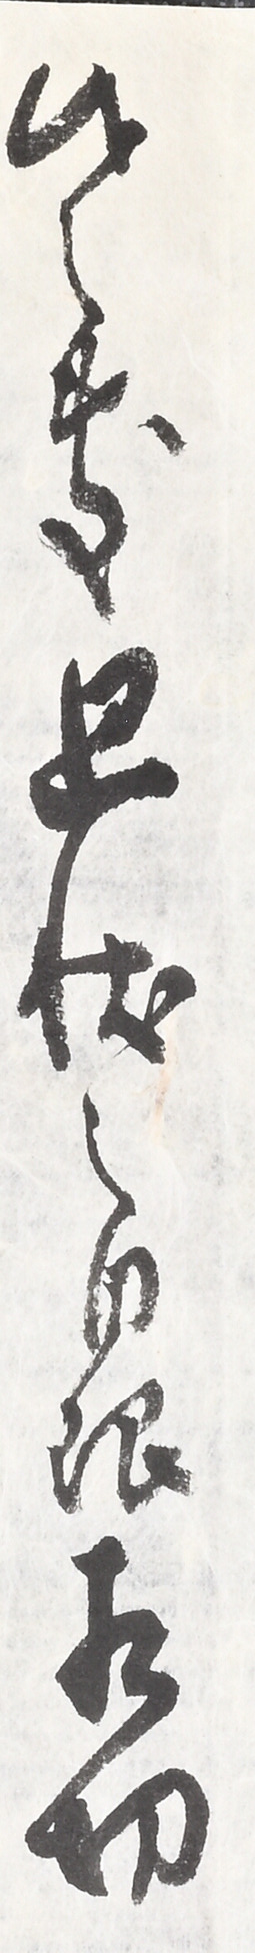候之処廻状之日限相切
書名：廻章
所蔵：伊那市立高遠町図書館・合同会社AMANE
